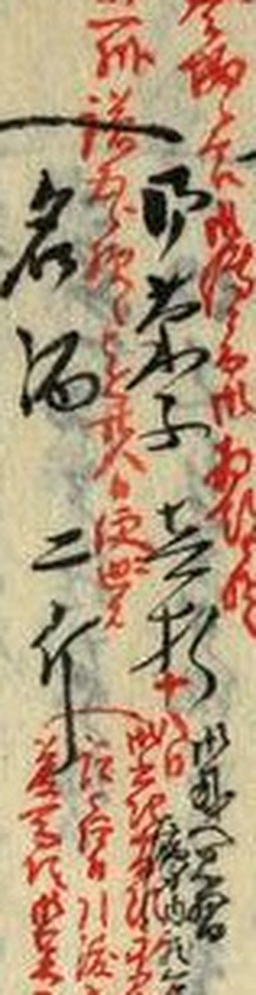名酒二斤
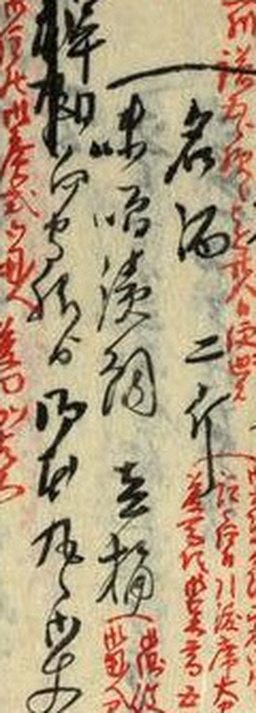味噌漬鯛壱桶
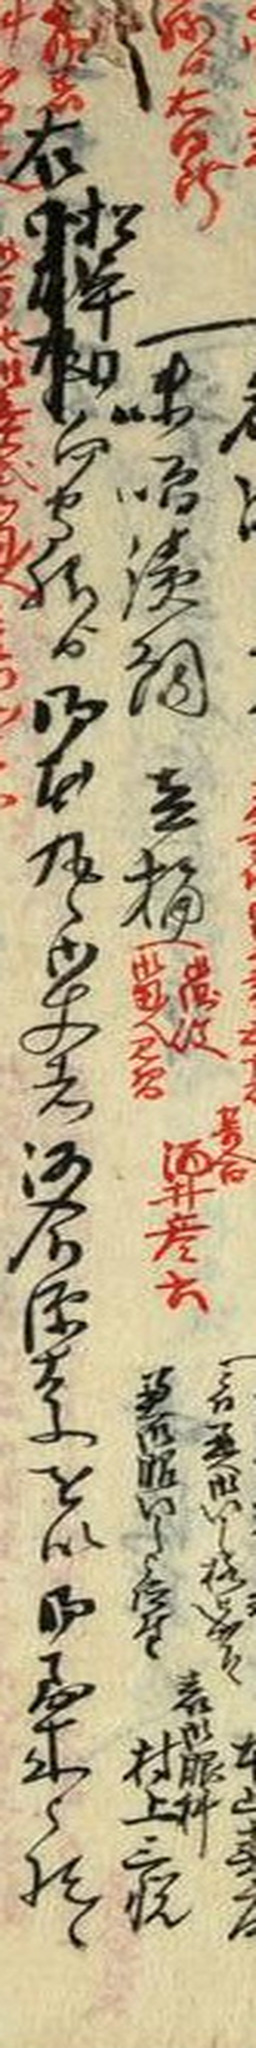右松平日向守様ゟ御本丸へ御使者河合源太夫を以御到来被遊候
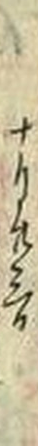十月廿三日
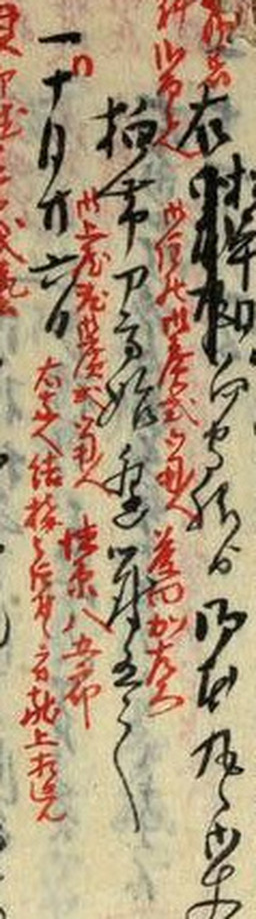狛帯刀方始逢対有之
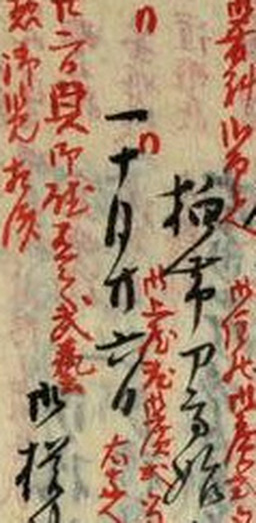一十月廿六日

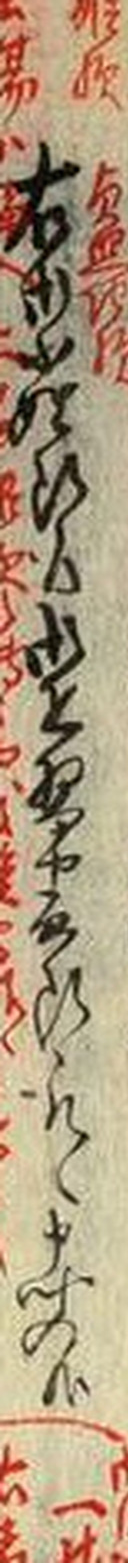右御小姓頭取御近習番頭取へ申聞候
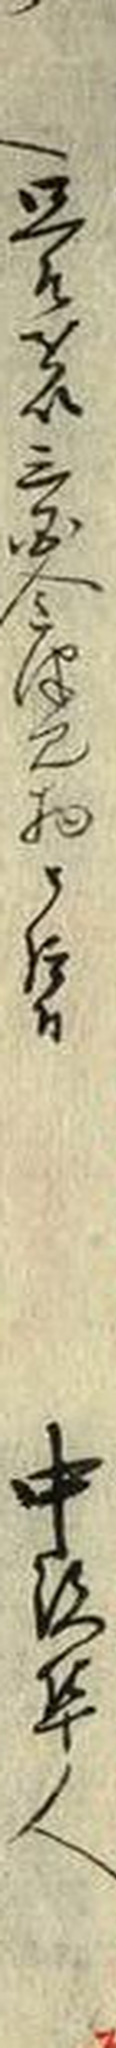思召を以三国金津見物被仰付中沢隼人
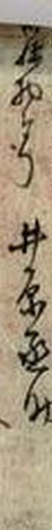御腰物奉行井原丞助
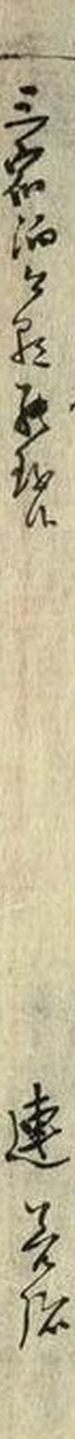三宿泊今朝罷越候連善弥
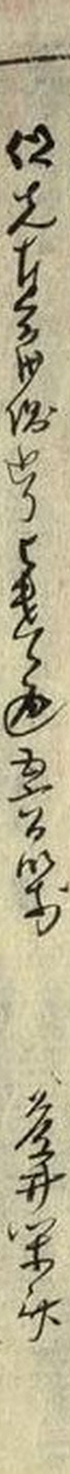但先達而御側廻り被遣候通五六日以前藤井閑斉
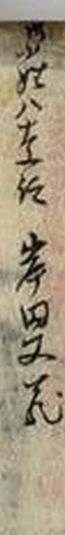御小姓八太夫跡岸田又蔵
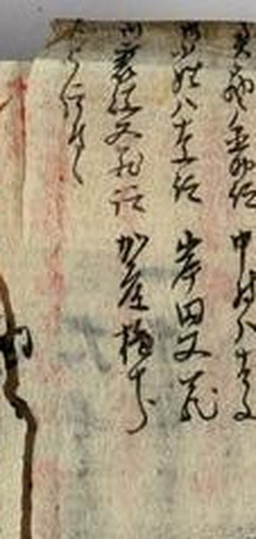御裏役又蔵跡加藤権十郎
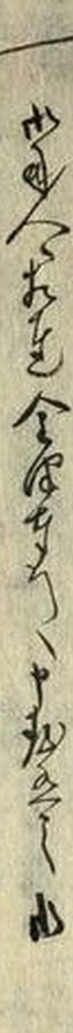御用人へ相達金津奉行へ申越有之御新藤斧蔵
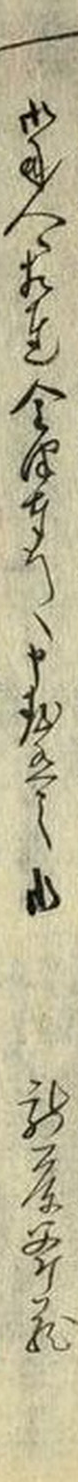御用人へ相達金津奉行へ申越有之御新藤斧蔵
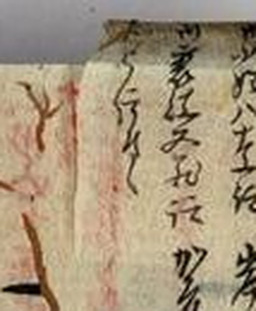被仰付候
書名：少傅日録抄（斉承付側向頭取日記、在国）
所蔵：福井県文書館 Fukui Prefectural Archives
